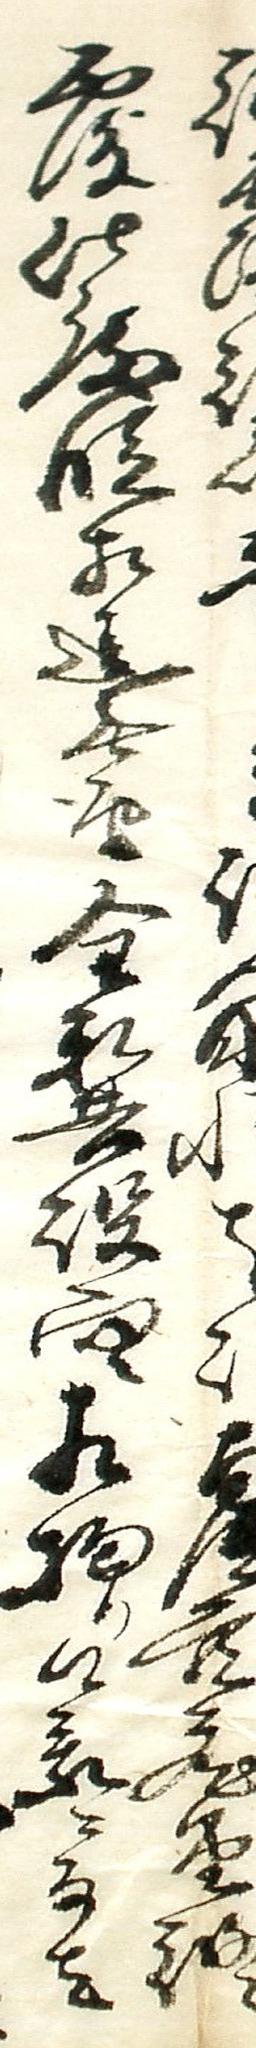覆仕度段相違無御坐候全私共役向ニ相拘り候義ニ而者
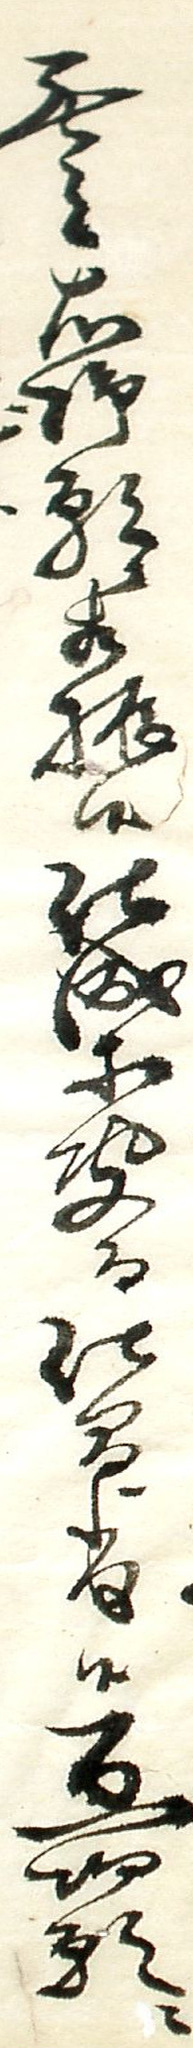無之右御願ニ相振候仕成等決而仕間布候万一御願ニ
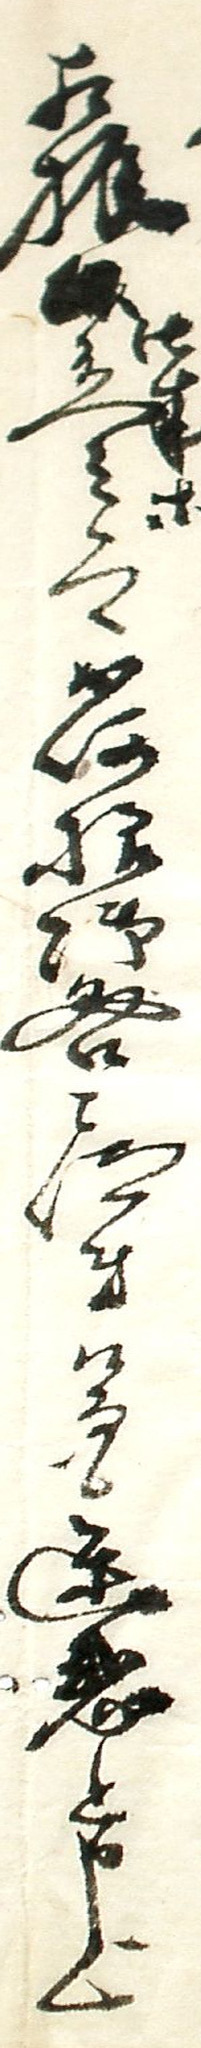相振候仕成等有之候ハヽ如何様御咎被仰付候而も迷惑と申上
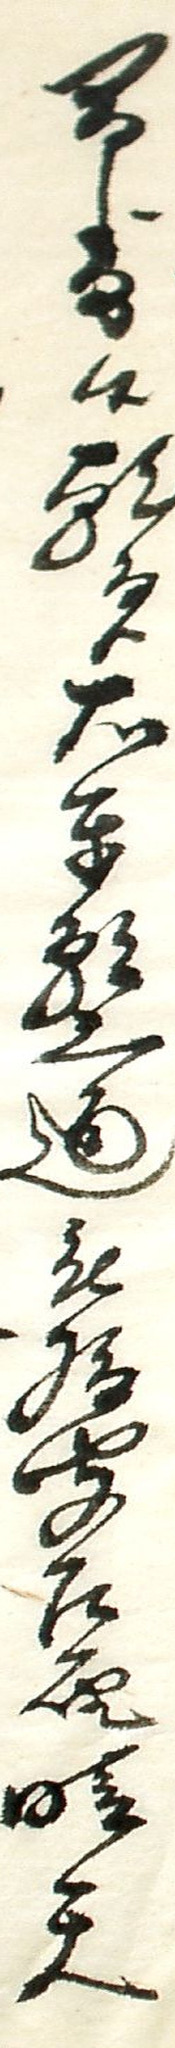間布候就而ハ右奉願上通被為聞召届晴天
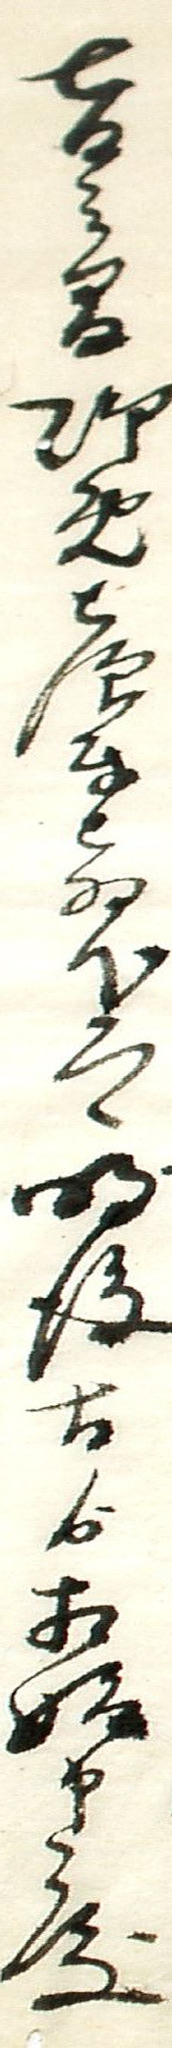七日之間御免被仰付被為下候ハヽ明後十日ゟ相始申度
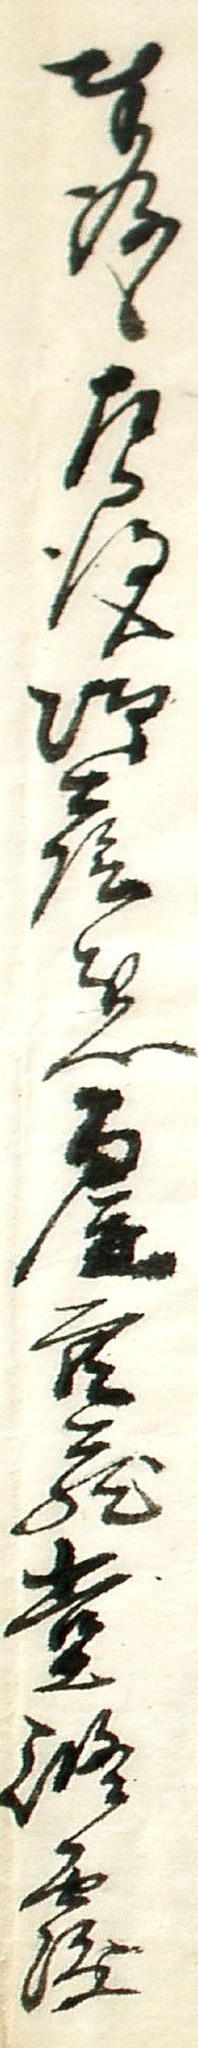奉存候左候得ハ御蔭を以虚空蔵堂修覆
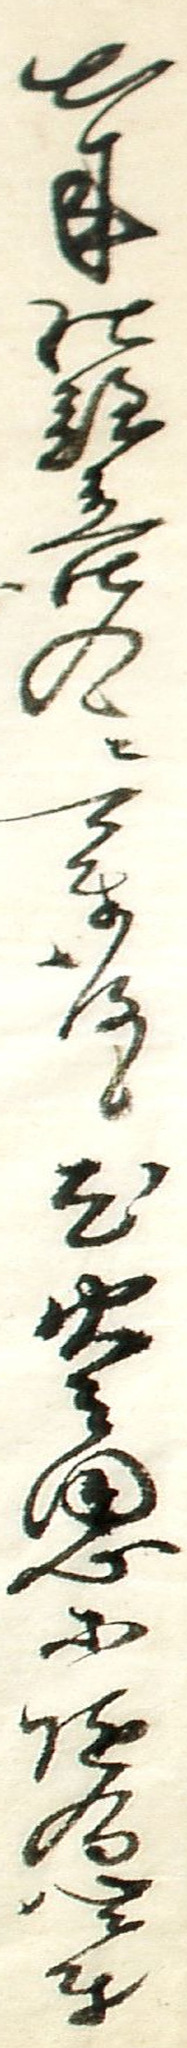出来仕難有仕合ニ可奉存候尤火之用心等随分心ヲ付
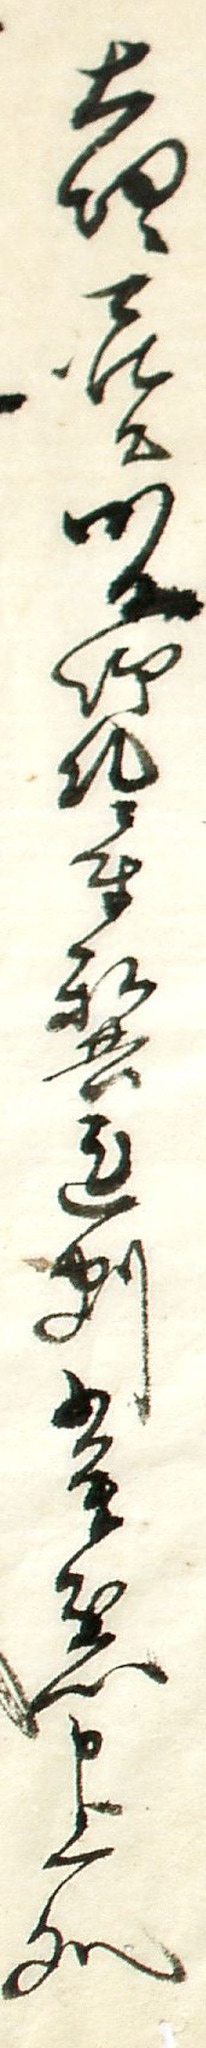大切ニ可仕候仍而御糺ニ付私共連判書付を以申上処
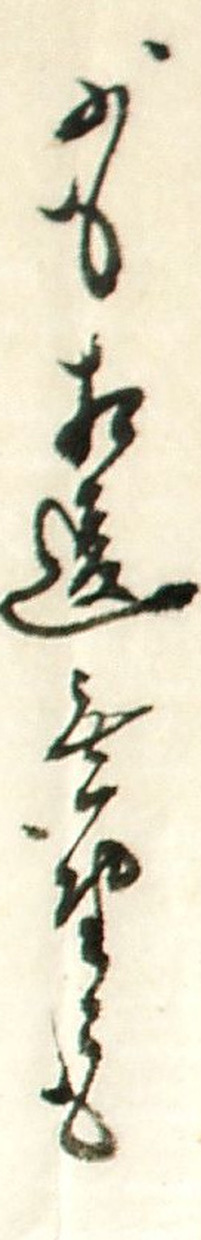少も相違無御坐候以上
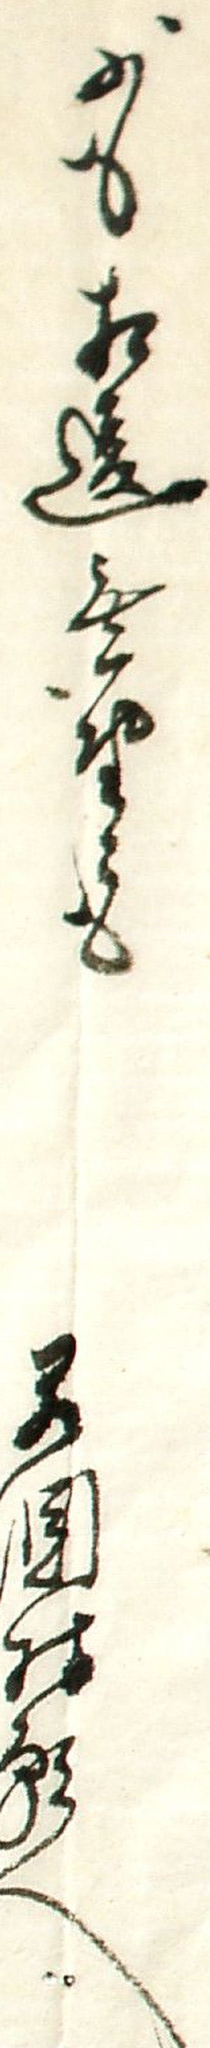少も相違無御坐候以上
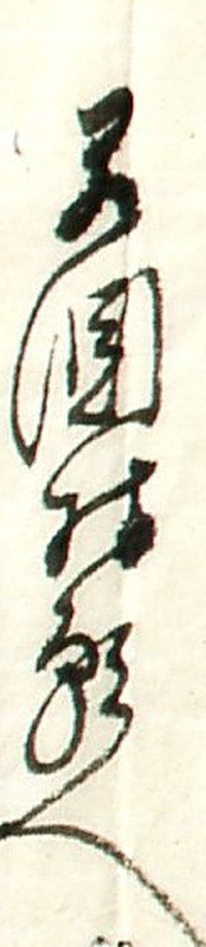早渕村願人
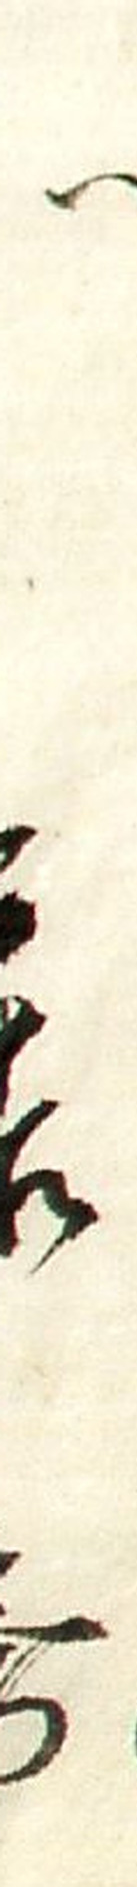々藤兵衛
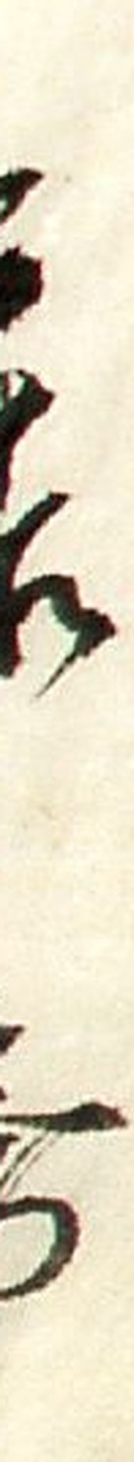々藤兵衛

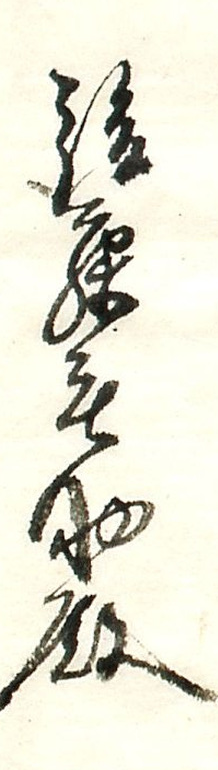後藤庄助殿
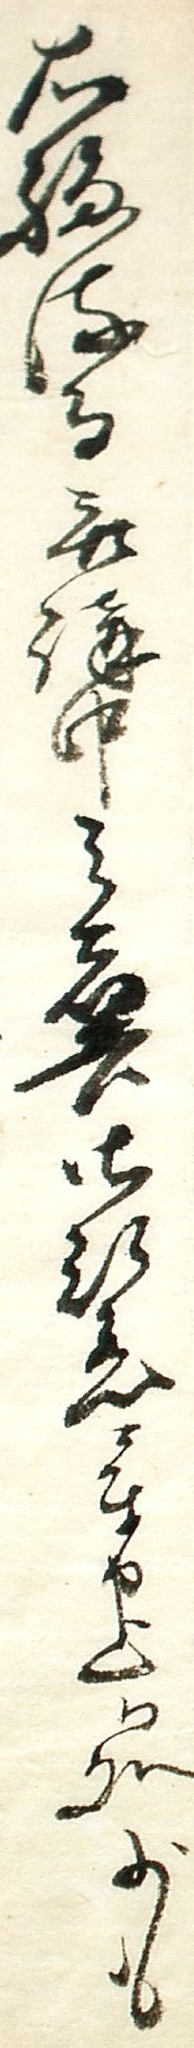右福満寺幷講中之者共御行着ニ付申上候処少も
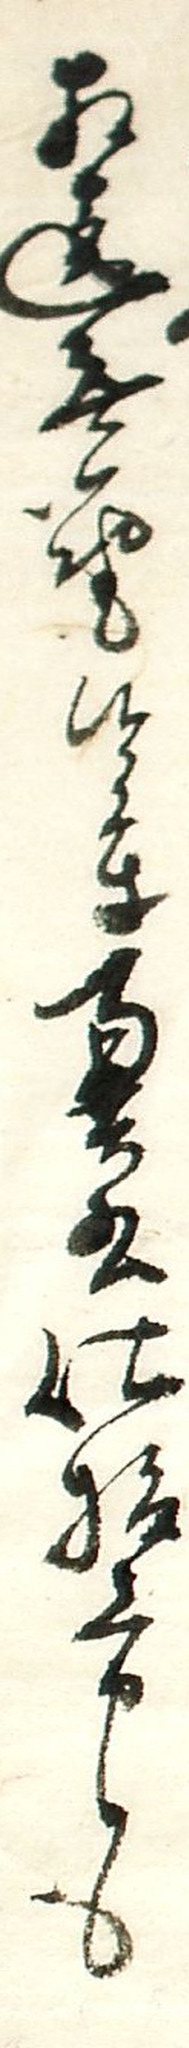相違無御坐候ニ付奥書仕指上申候以上
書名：（早渕村福満寺虚空蔵菩薩堂修復のためおどけ軍書講談願行着添え書控）
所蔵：鳴門教育大学 Naruto University of Education
